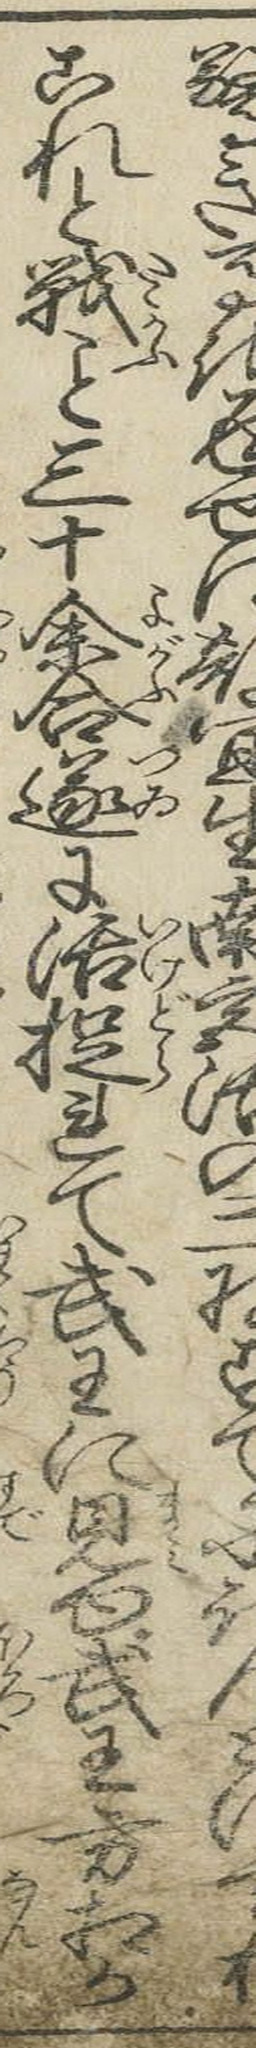これと戦こと三十余合遂に活捉れて武王に見ゆ武王方相か
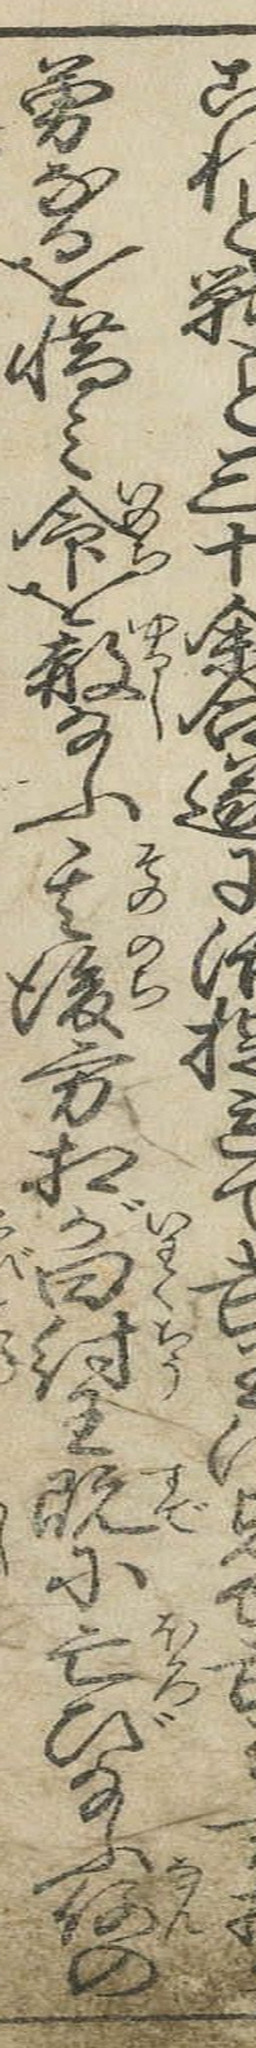勇なるを惜み命を赦給ふ其後方相が曰紂王既に亡び給ふ何の
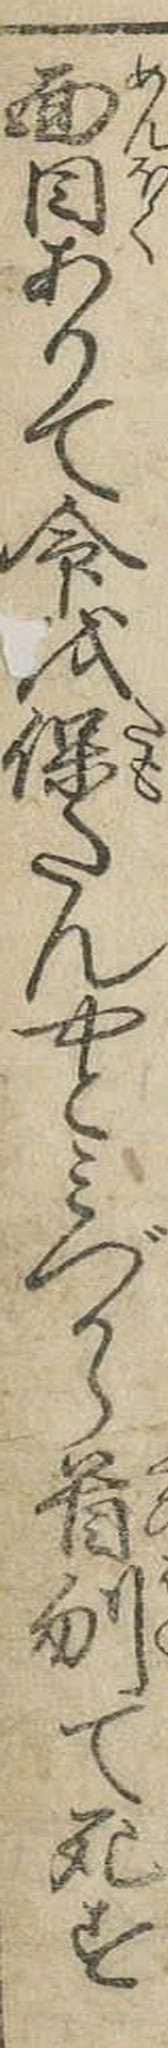面目ありて命を保たんやとみづから首刎て死す

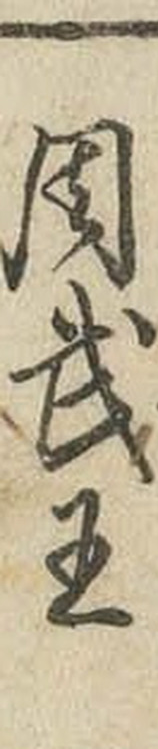周武王
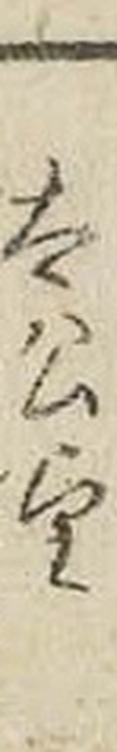太公望
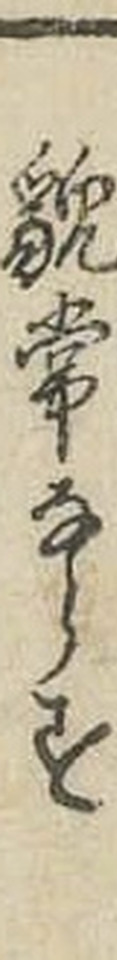貌常ならす
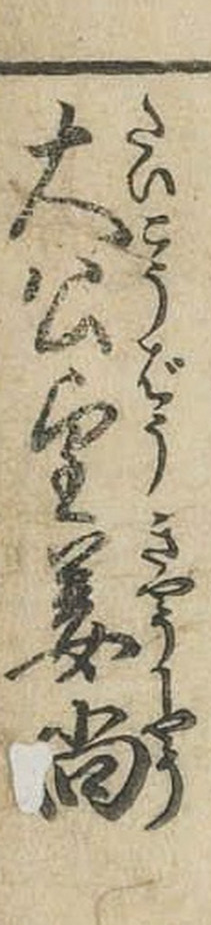大公望姜尚

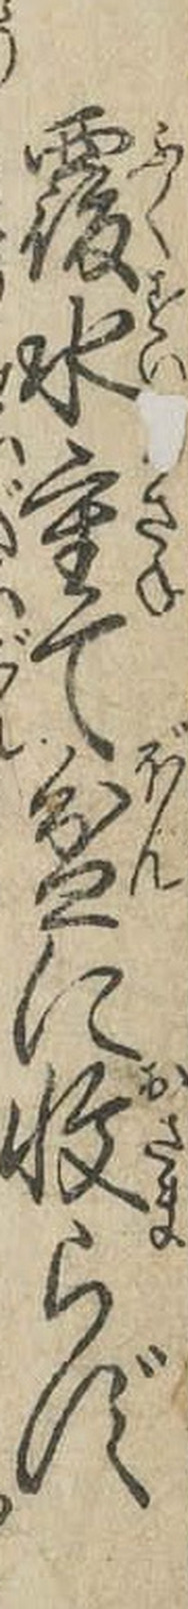覆水重て盆に収らず
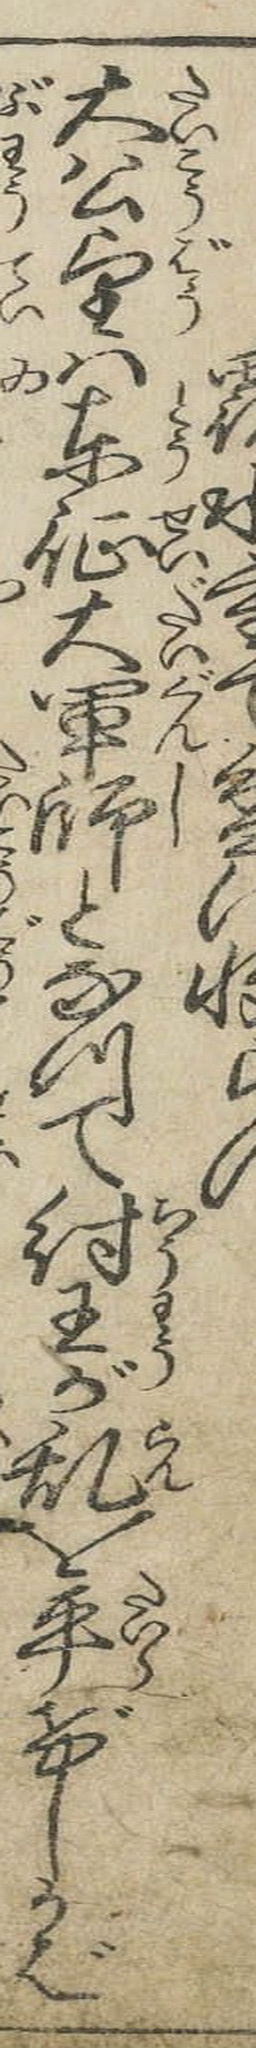大公望は東征大軍師となつて紂王が乱を平げしかば
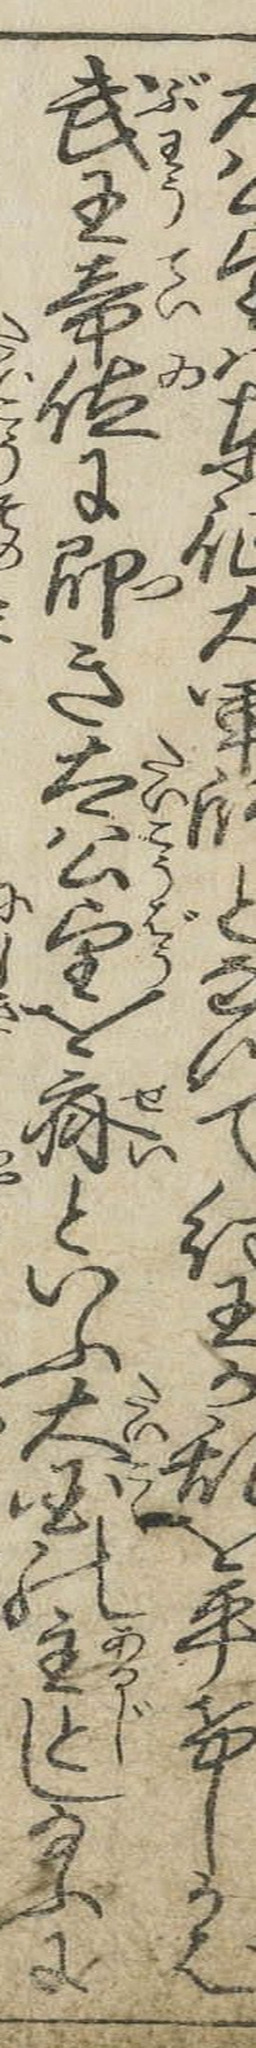武王帝位に即き太公望を斉といふ大国の主とし給ふに
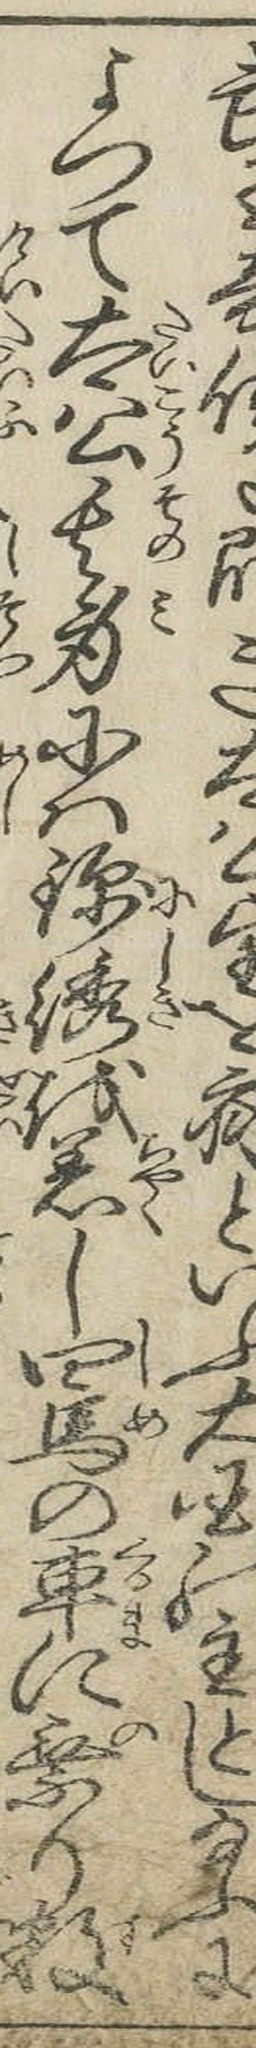よつて太公其身には錦繍を着し四馬の車に乗り数
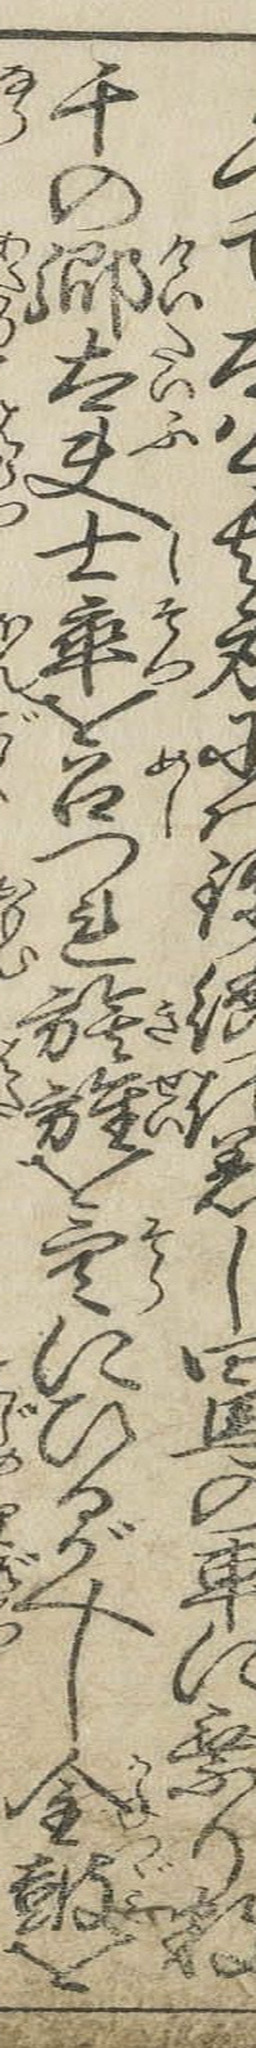千の卿太夫士卒を召つれ旗旌を空にひるがへし金鼓を
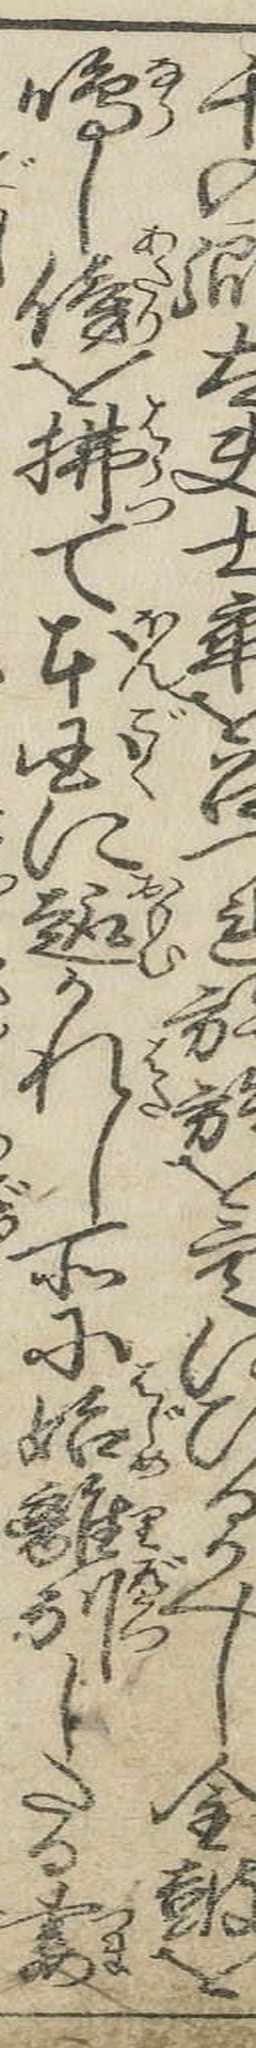鳴し傍を払て本国に趣かれし所に始離別したる妻
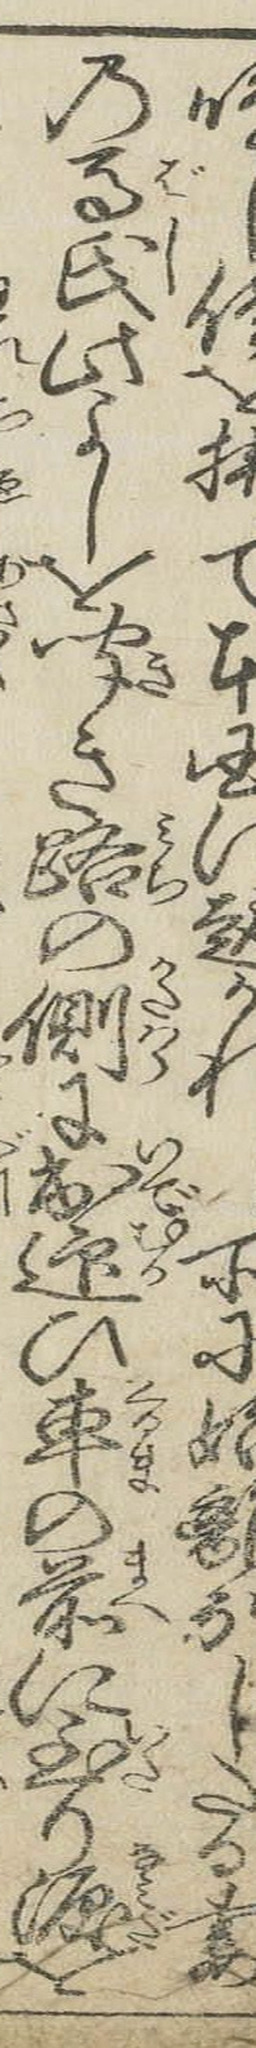の馬氏此よしを聞き路の側に出迎ひ車の前に至り涙を
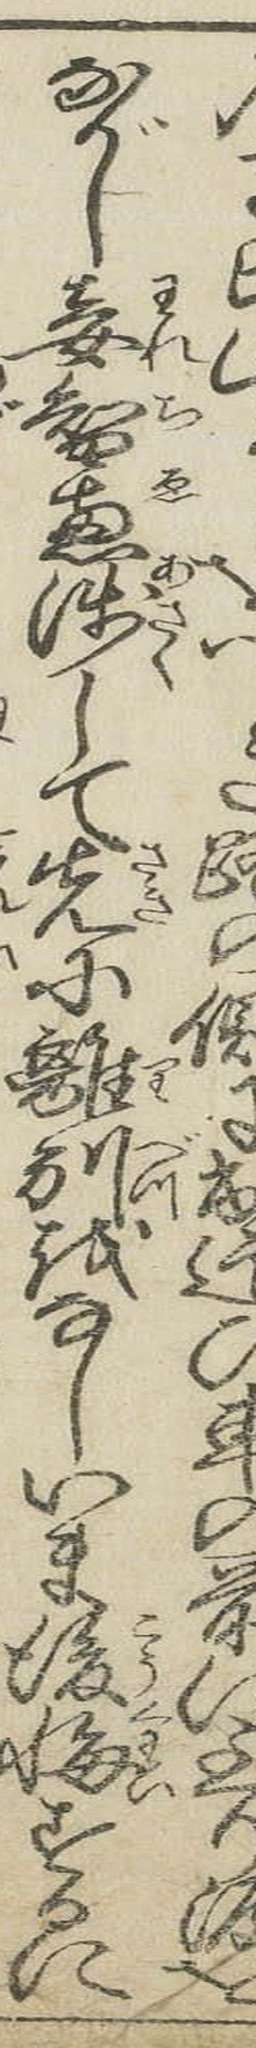ながし妾智恵浅して先に離別をなしいま後悔するに
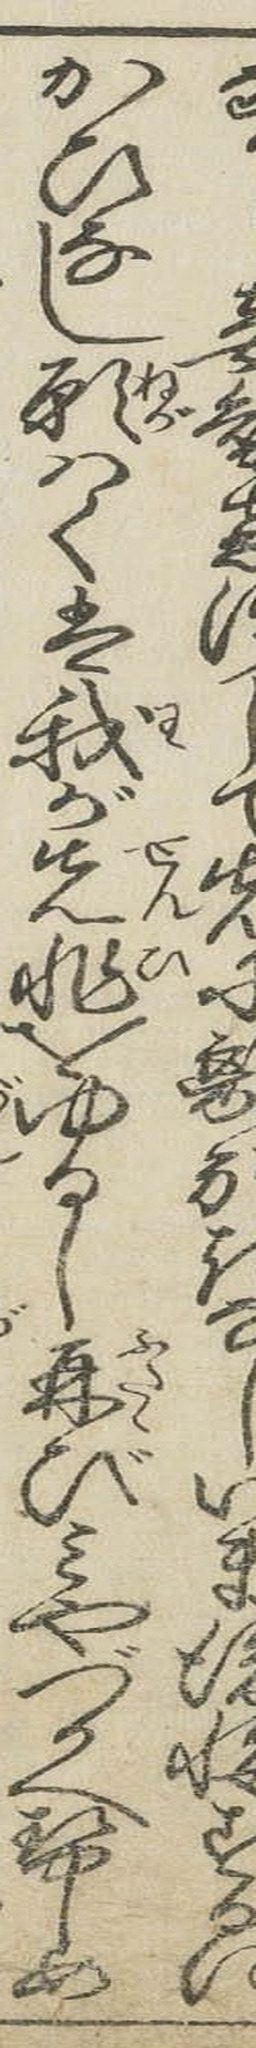かひなし願はくは我が先非をゆるし再びみやづかへせしめ
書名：絵本写宝袋 9巻 5之巻
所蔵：東京学芸大学教育コンテンツアーカイブ
